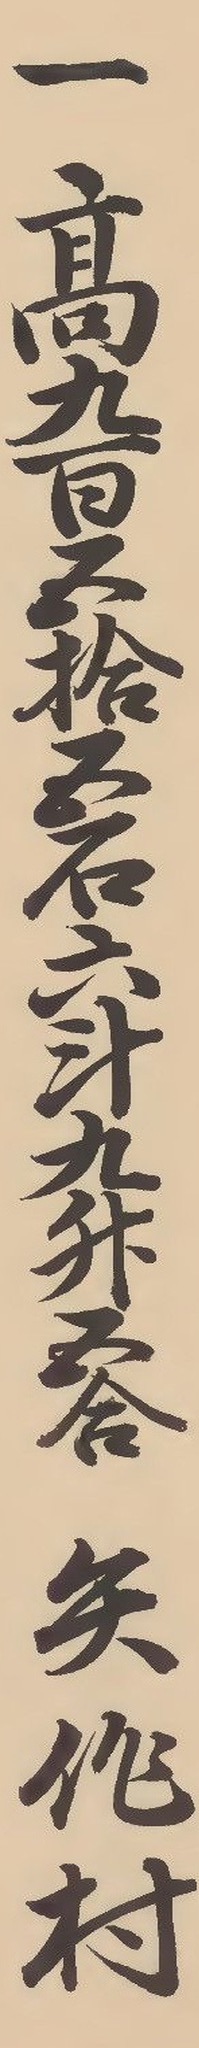一高九百五拾五石六斗九升五合矢作村
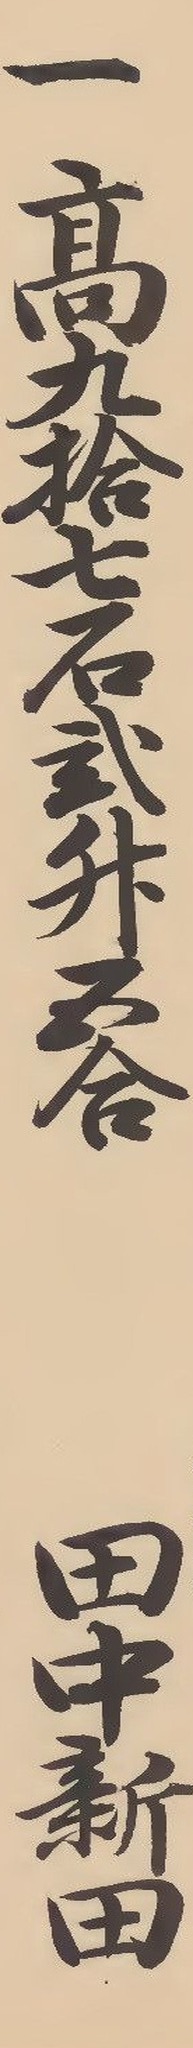一高九拾七石弐升五合田中新田
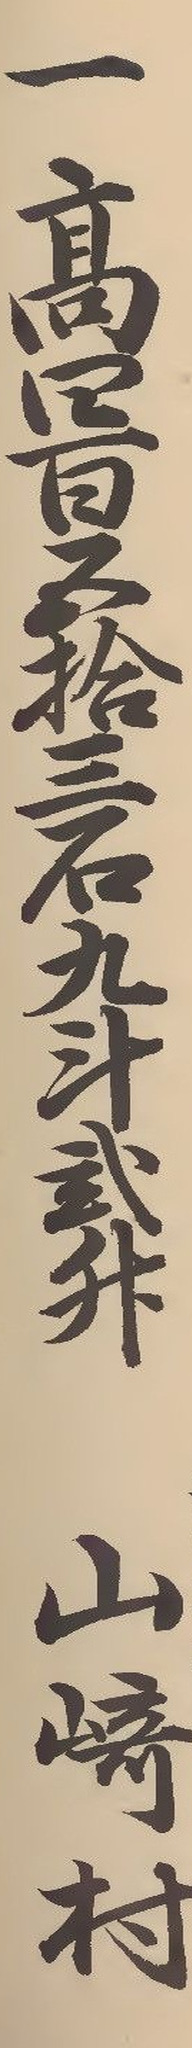一高四百五拾三石九斗弐升山崎村
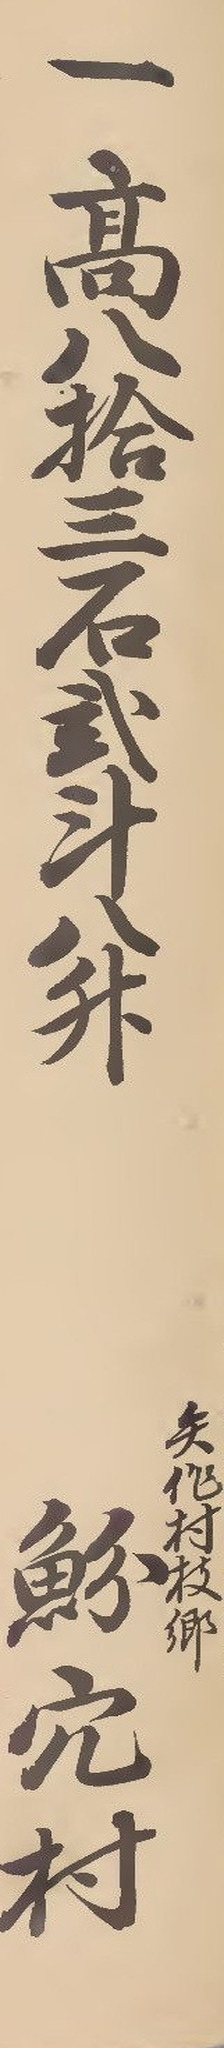一高八拾三石弐斗八升魵穴村
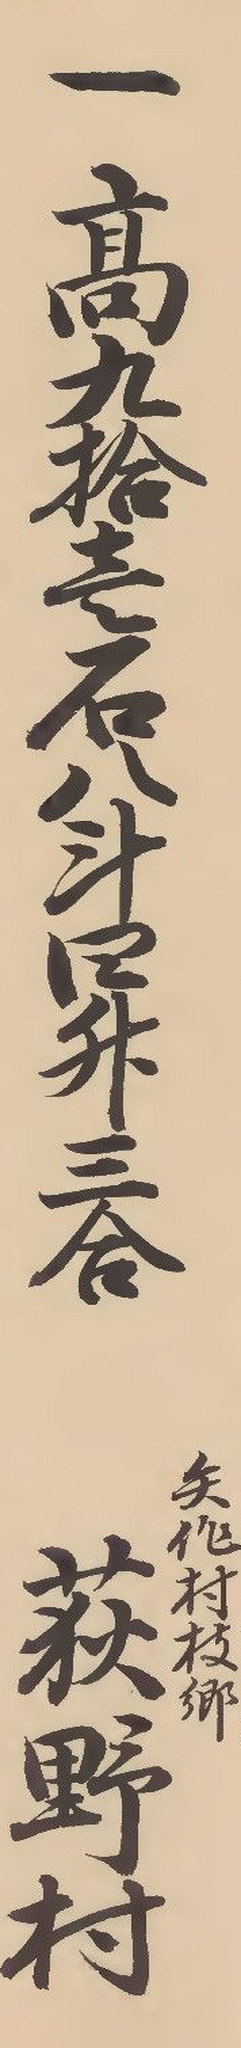一高九拾壱石八斗四升三合荻野村
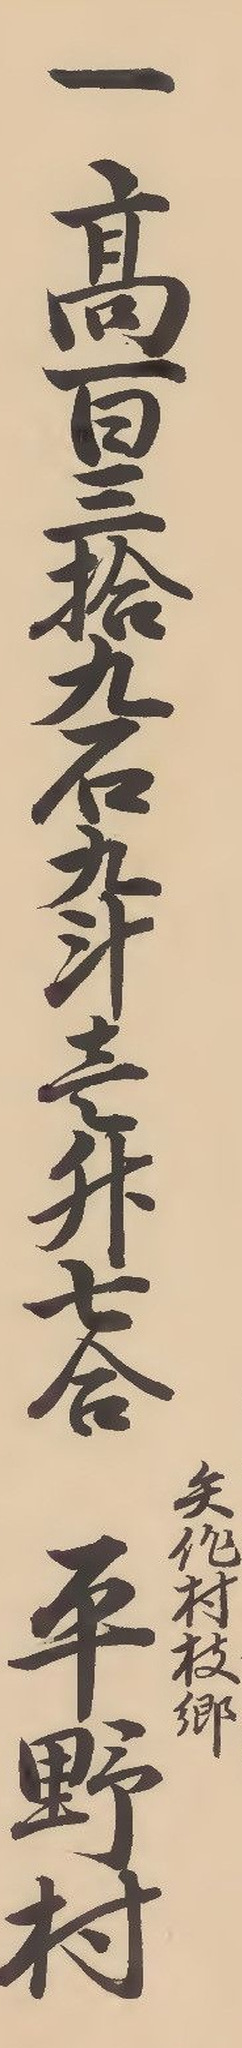一高百三拾九石九斗壱升七合平野村
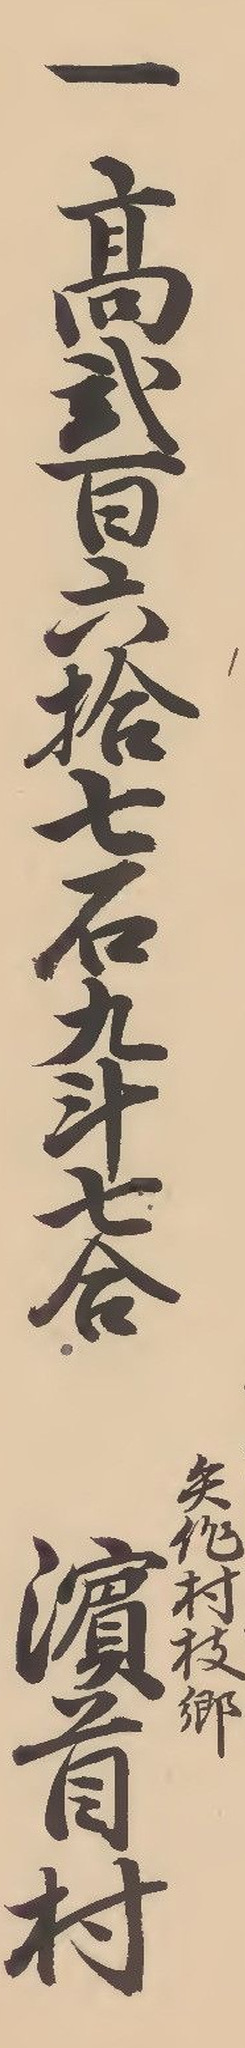一高弐百六拾七石九斗七合浜首村

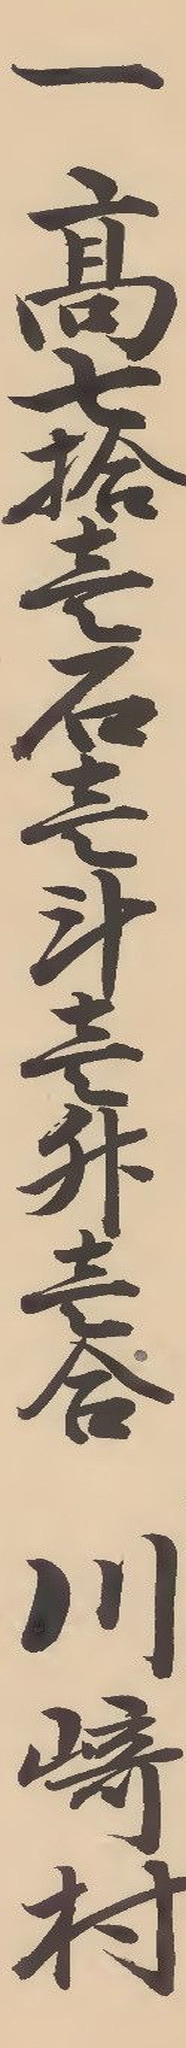一高七拾壱石壱斗壱升壱合川崎村
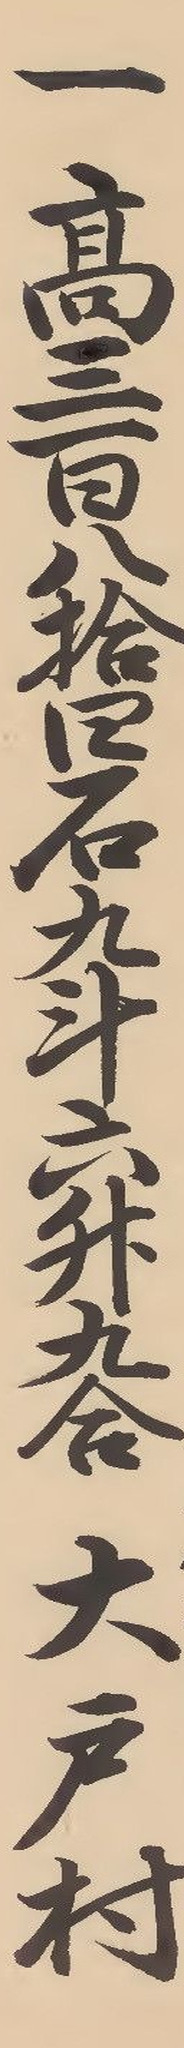一高三百八拾四石九斗六升九合大戸村
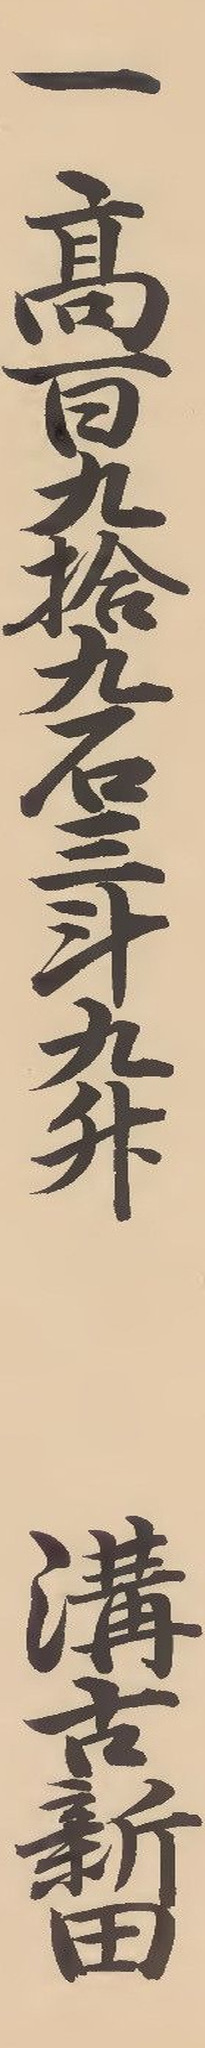一高百九拾九石三斗九升溝古新田
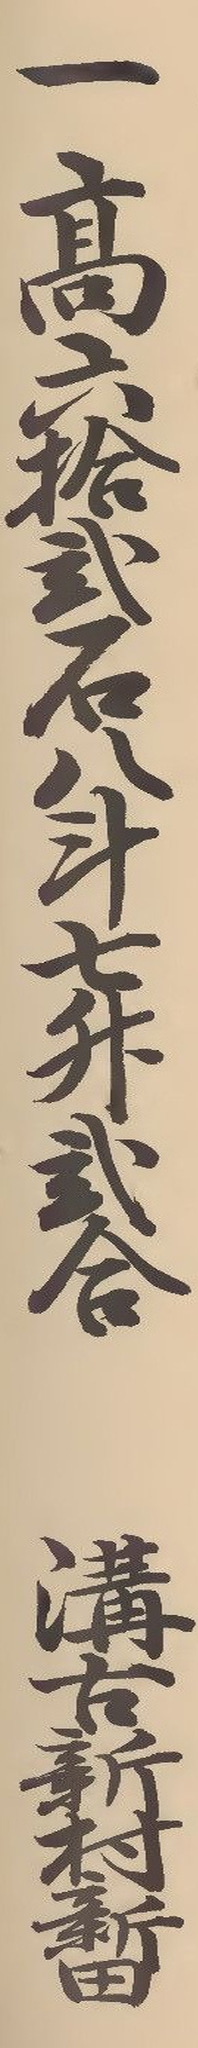一高六拾弐石八斗七升弐合溝古新村新田
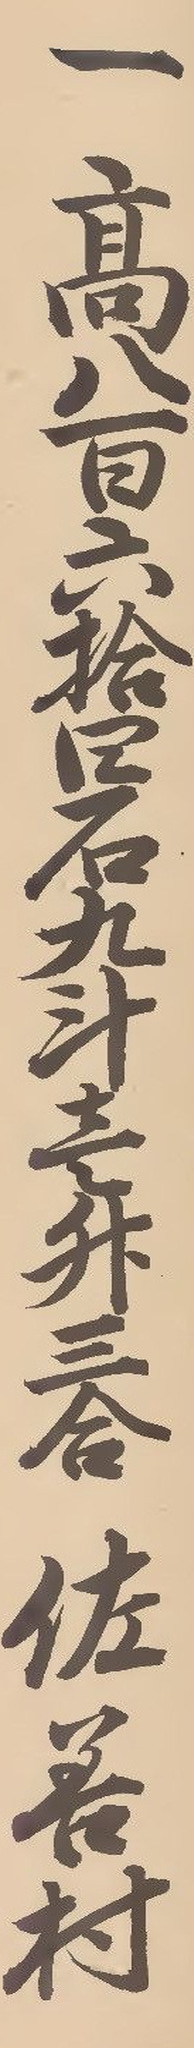一高八百六拾四石九斗壱升三合佐善村
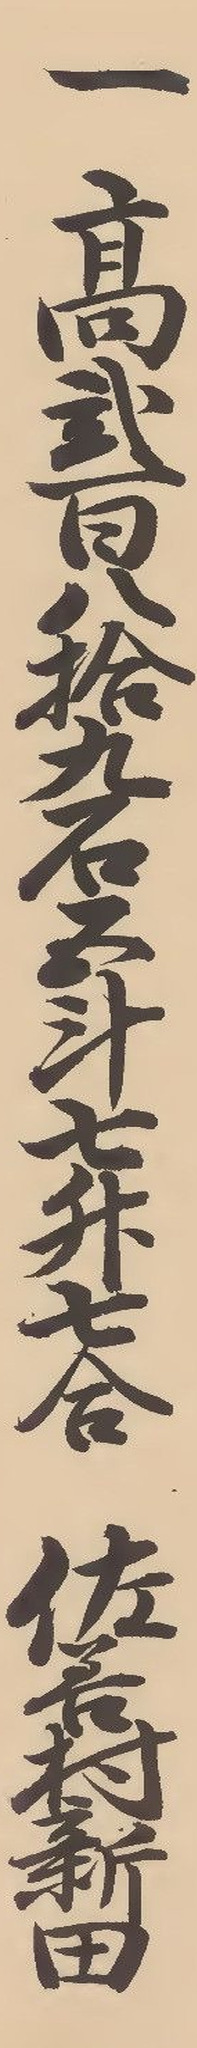一高弐百八拾九石五斗七升七合佐善村新田
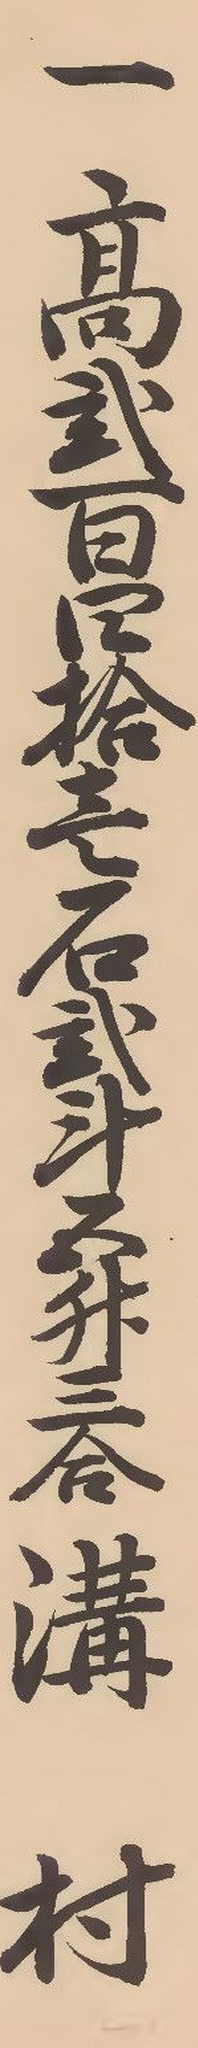一高弐百四拾壱石弐斗五升三合溝村
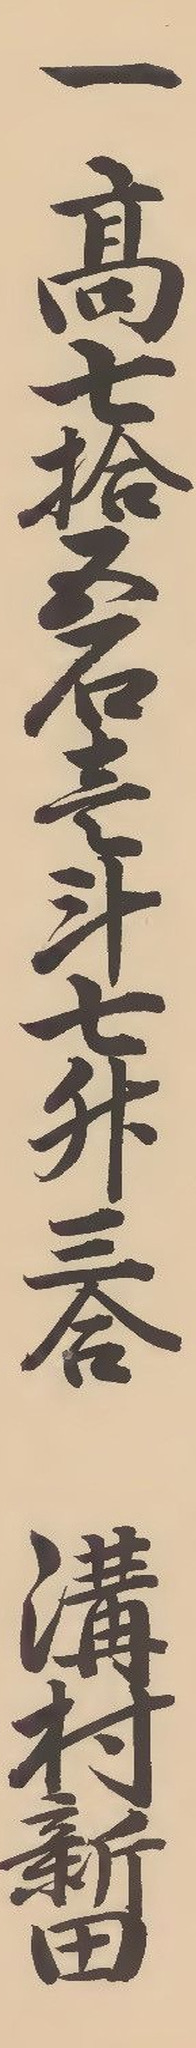一高七拾五石壱斗七升三合溝村新田

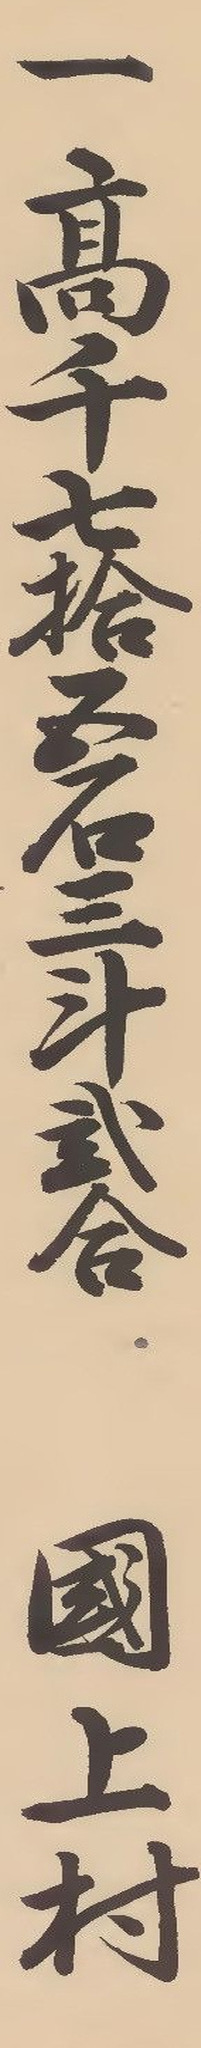一高千七拾五石三斗弐合国上村
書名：越後国郷帳　下
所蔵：国立公文書館 National Archives of Japan
